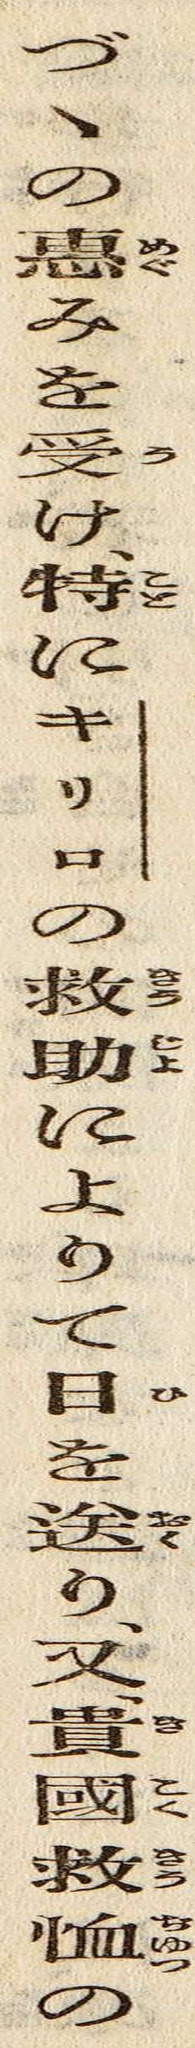づゝの恵みを受け、特にキリロの救助によりて日を送り、又、貴国救恤の
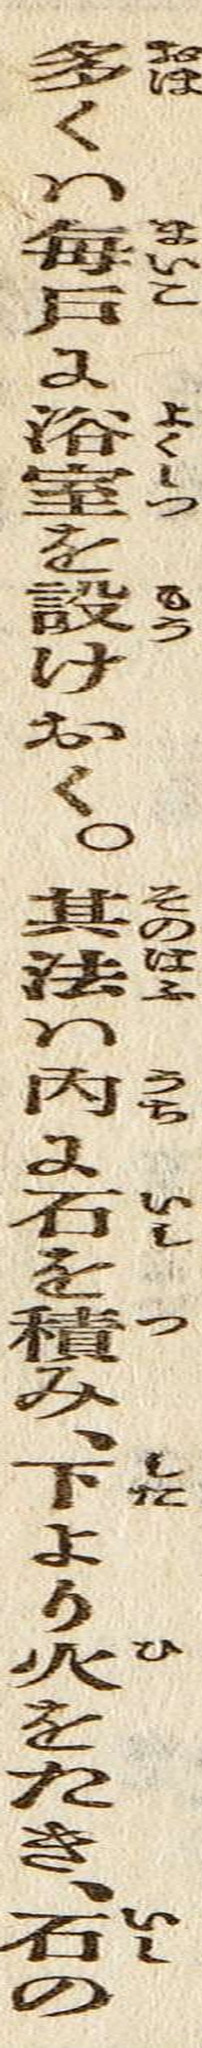多くは毎戸に浴室を設けおく。其法は内に石を積み、下より火をたき、石の
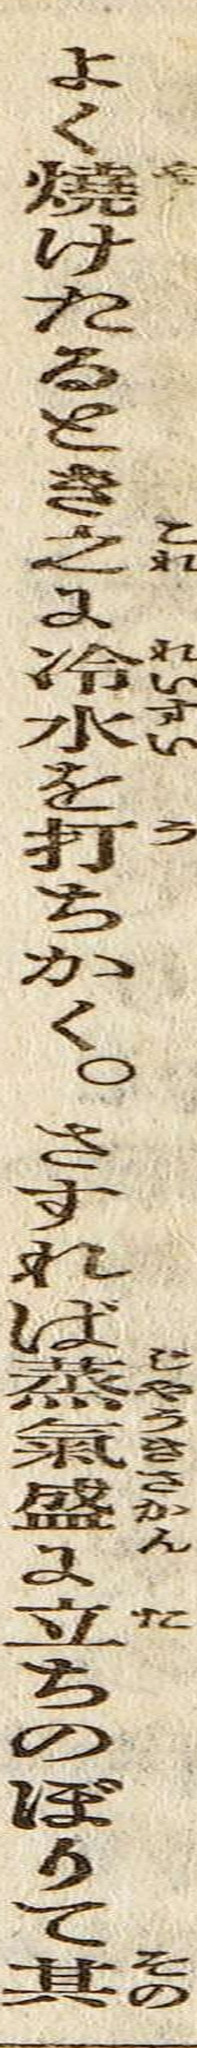よく焼けたるとき之に冷水を打ちかく。さすれば蒸気盛に立ちのぼりて其
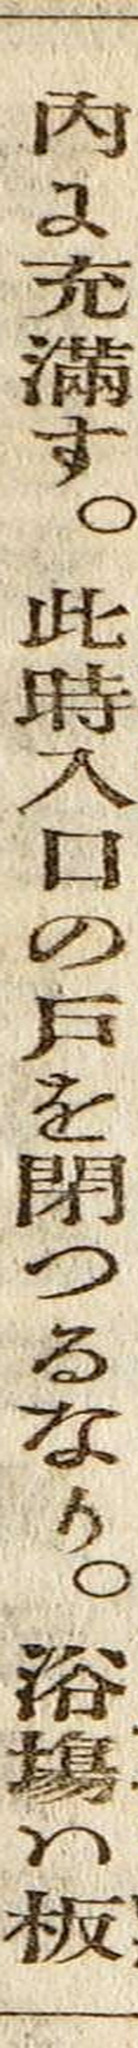内に充満す。此時入口の戸を閉つるなり。浴場は板
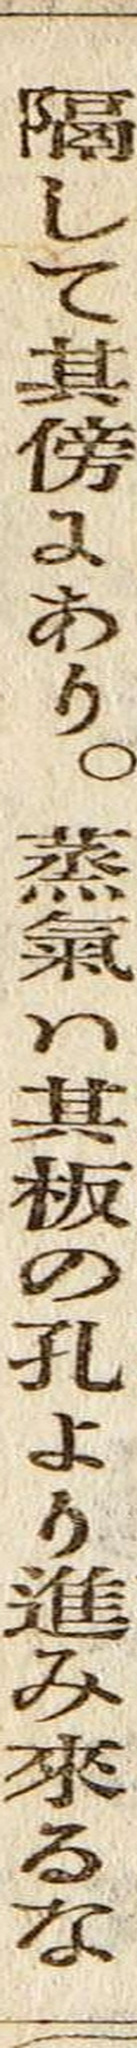隔して其傍にあり。蒸気は其板の孔より進み来るな
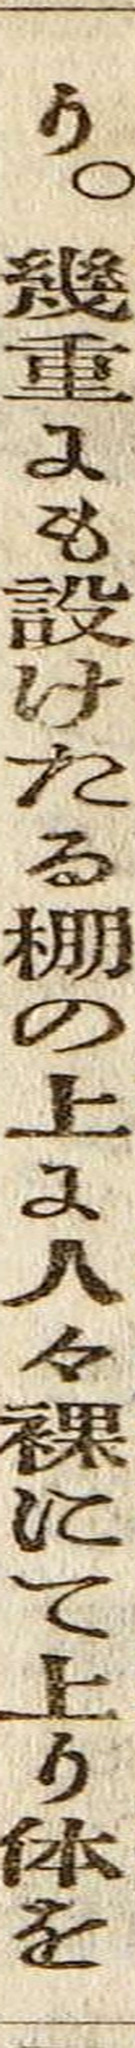り。幾重にも設けたる棚の上に人々裸にて上り体を
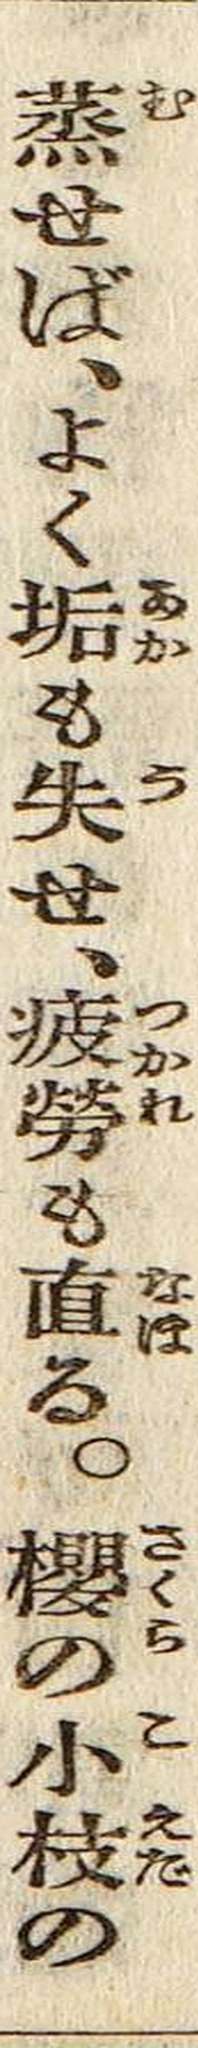蒸せば、よく垢も失せ、疲労も直る。桜の小枝の
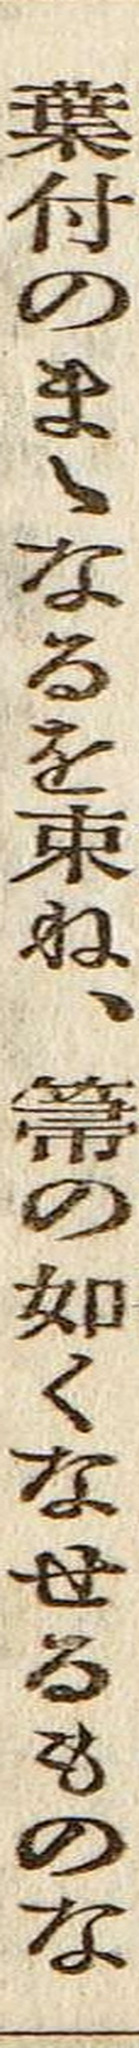葉付のまゝなるを束ね、箒の如くなせるものな
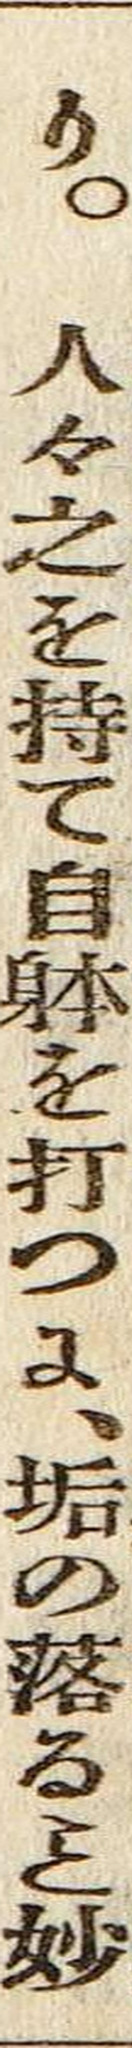り。人々之を持て自躰を打つに、垢の落ること妙
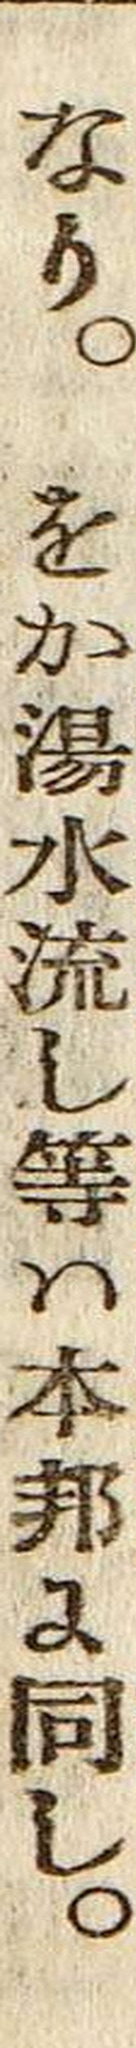なり。をか湯水流し等は本邦に同し。

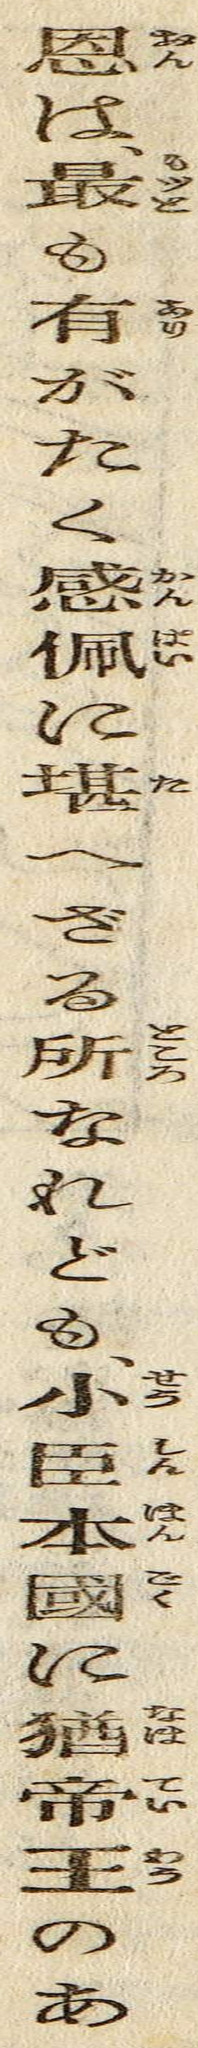恩は、最も有がたく感佩に堪へざる所なれども、小臣本国に猶帝王のあ
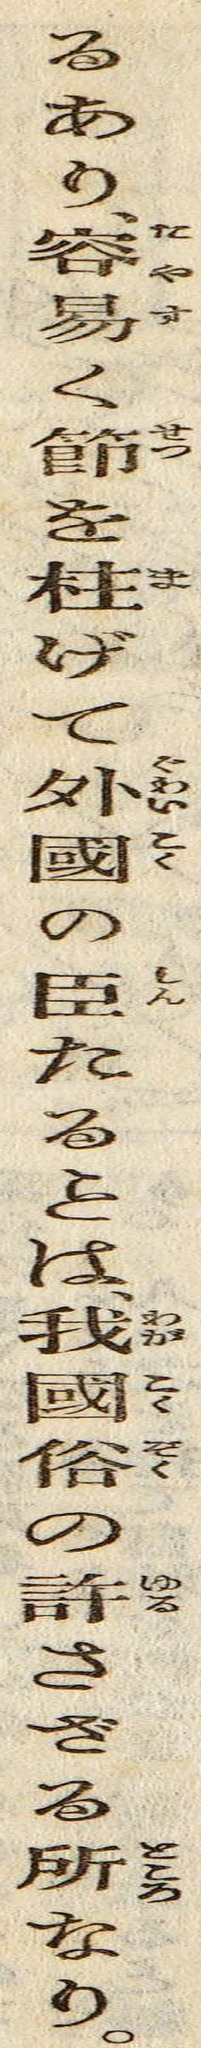るあり、容易く節を柱げて外国の臣たることは、我国俗の許さざる所なり。
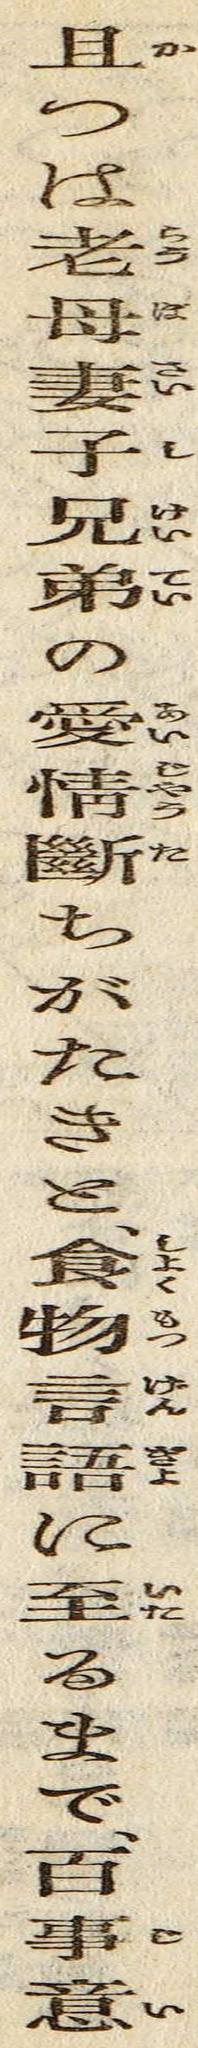且つは老母妻子兄弟の愛情断ちがたきと、食物言語に至るまで、百事意
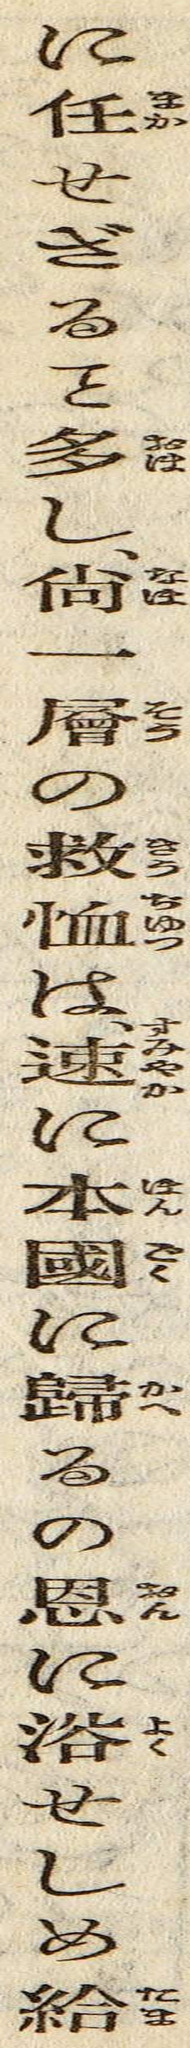に任せざること多し、尚一層の救恤は、速に本国に帰るの恩に欲せしめ給
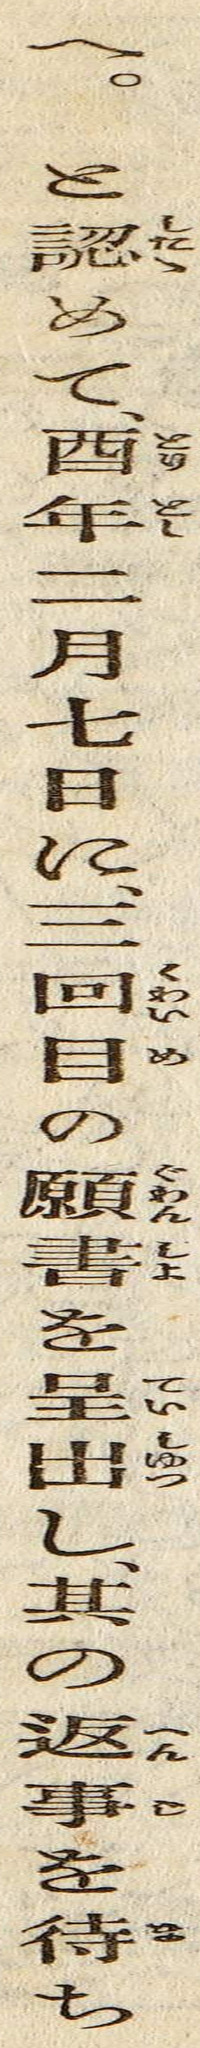へ。と認めて、酉年二月七日に、三回目の願書を呈出し、其の返事を待ち
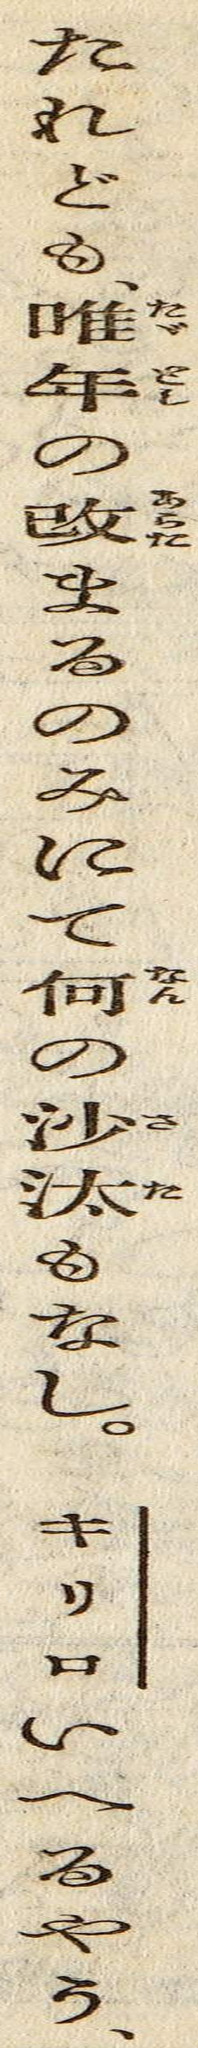たれども、唯年の改まるのみにて何の沙汰もなし。キリロいへるやう、
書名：日本漂流譚
